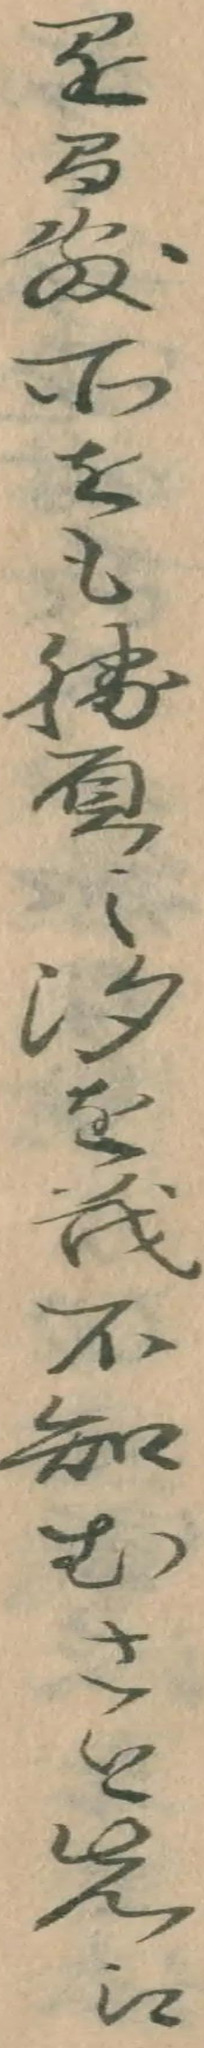懸間敷所をも勝負之汐を茂不知むさと先江

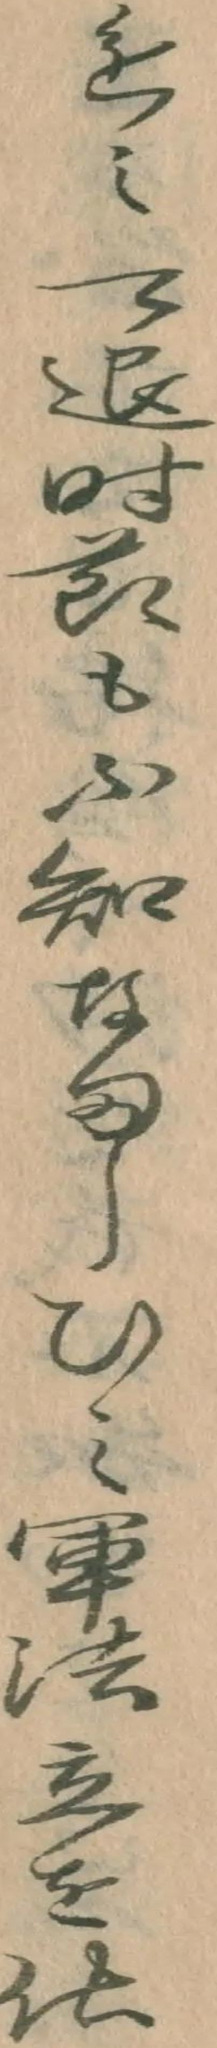進之可退時節もふ知な多しひ之軍法立を仕
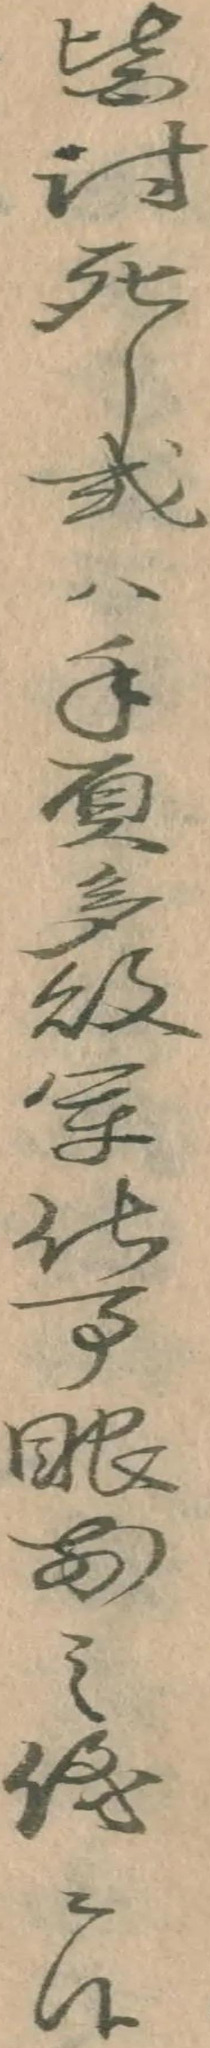皆討死し或は手負多敗軍仕事眼前之儀に候
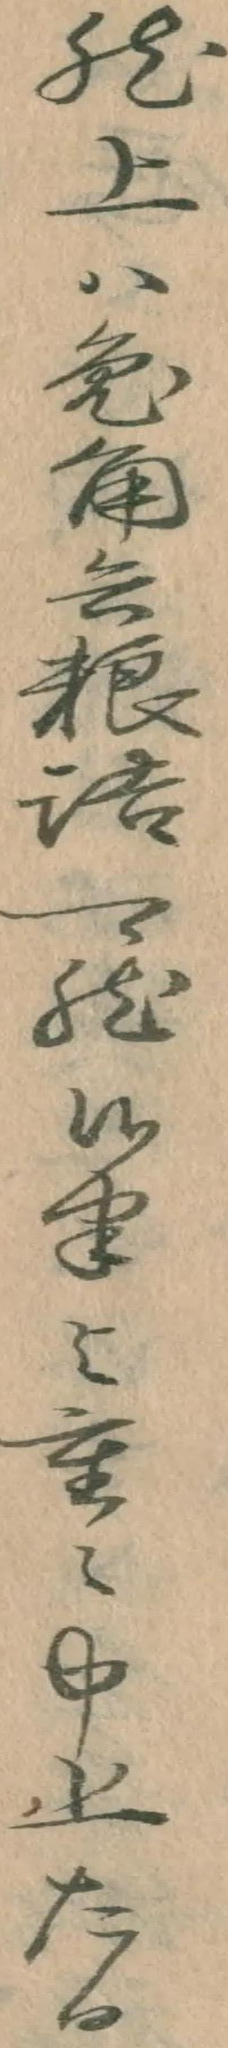然上は兎角兵粮詰可然候半与重々申上たる
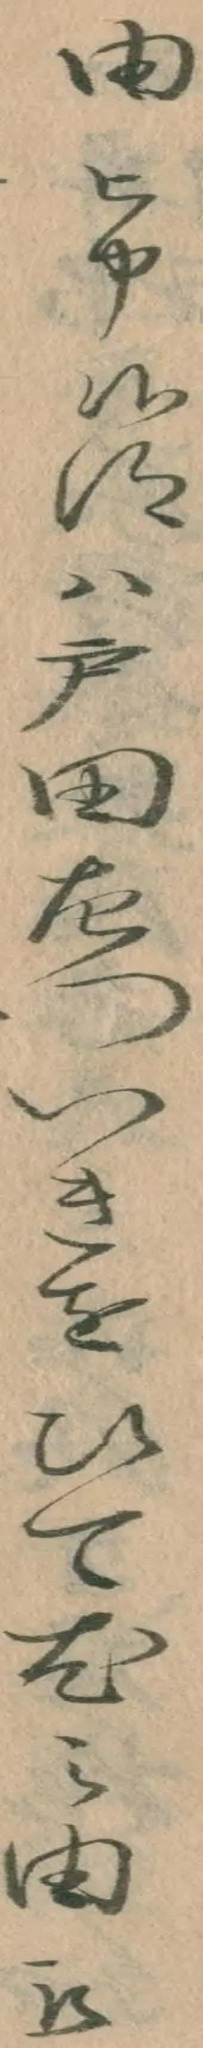由被申候得は戸田左門いきをひて尤之由被
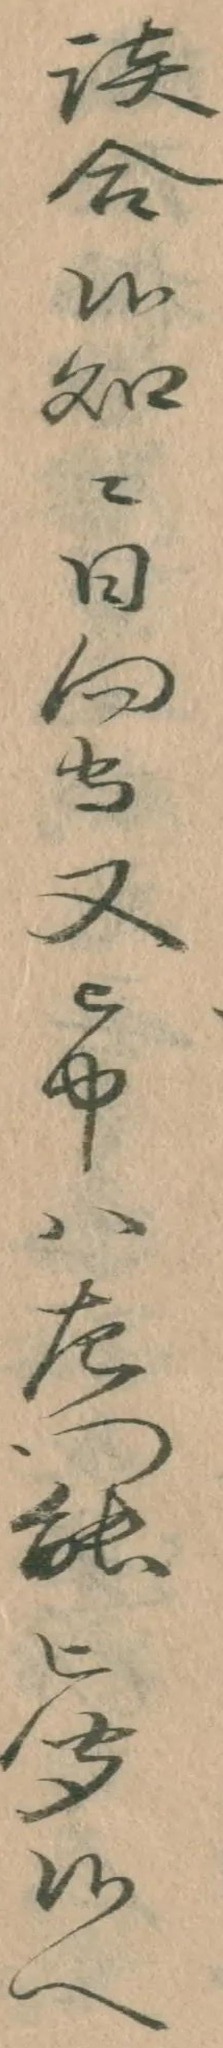談合候処に日向守又被申は左門能被聞候へ
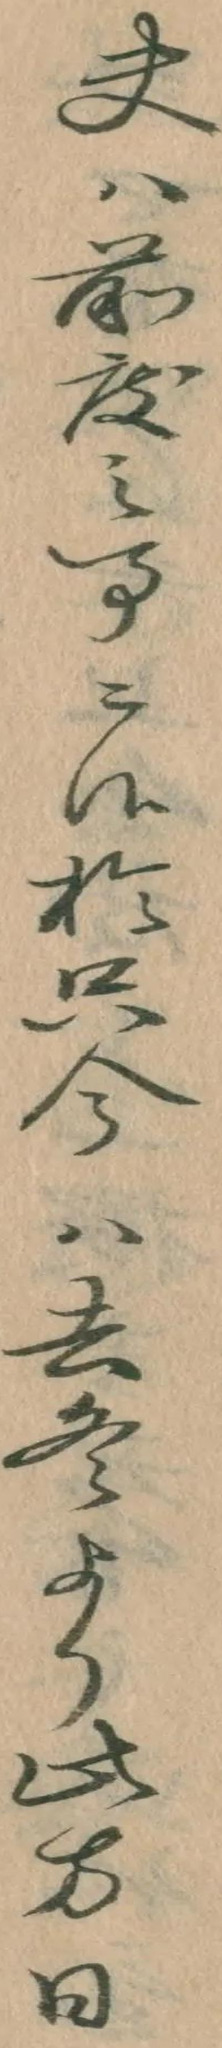夫は前度之事に候於只今は去冬より此方日
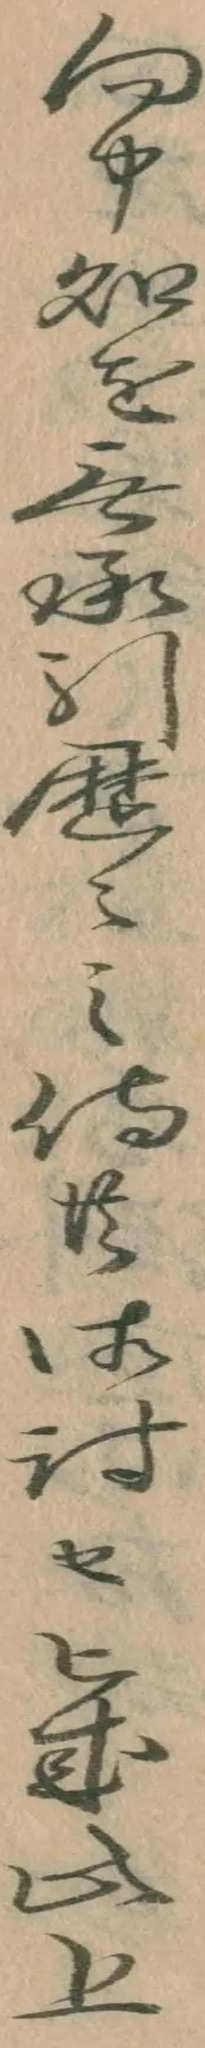向申処を無承引歴々之侍共御討せ被成此上
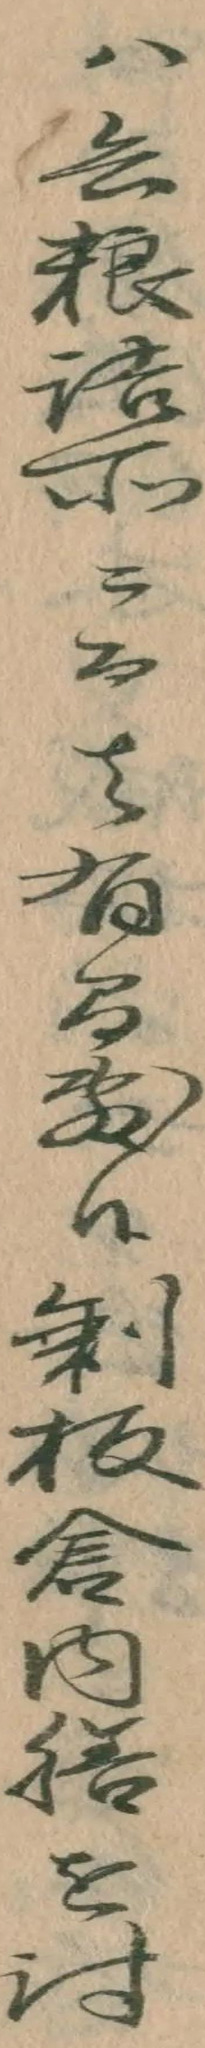は兵粮詰所に而者有馬敷候剰板倉内膳を討
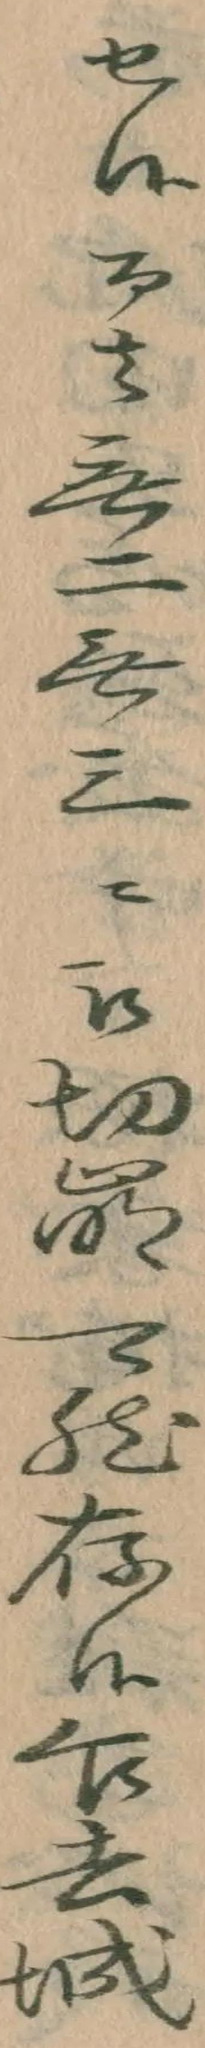せ候而者無二無三に被切崩可然存候乍去城
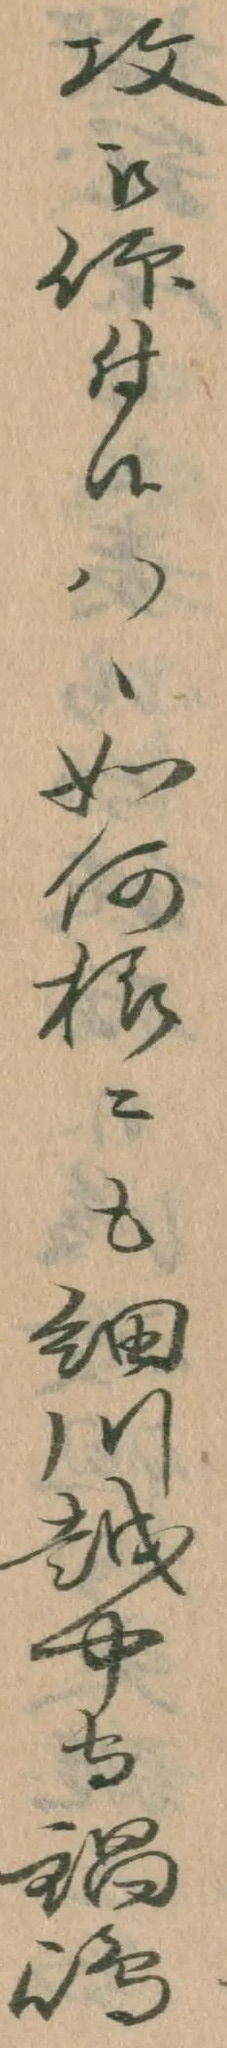攻被仰付候はゝ如何様にも細川越中守鍋島
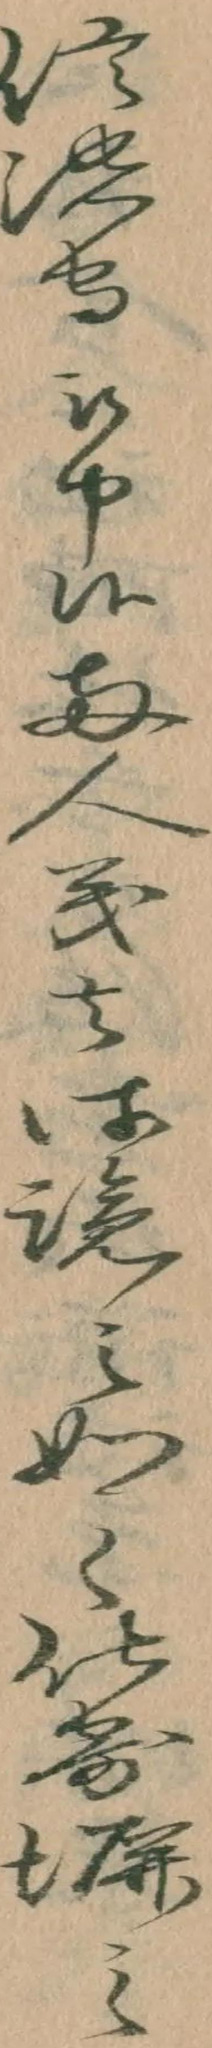信濃守被申候両人茂者御覧之如く仕寄塀之
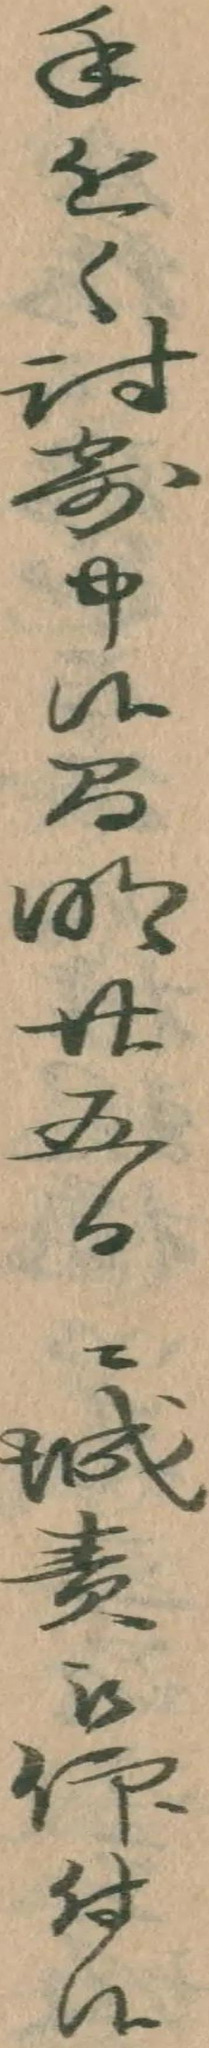手近く打寄申候間明廿五日に城責被仰付候
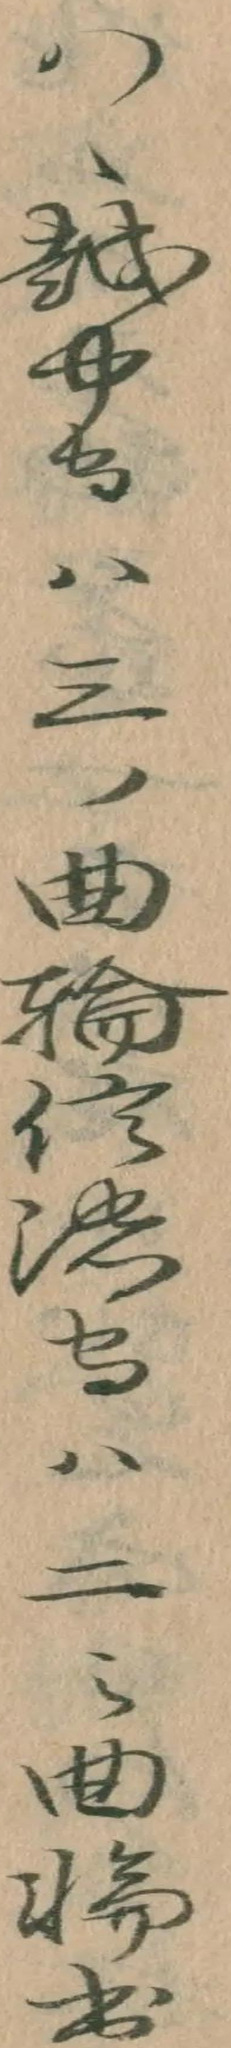はゝ越中守は三之曲輪信濃守は二之曲輪出
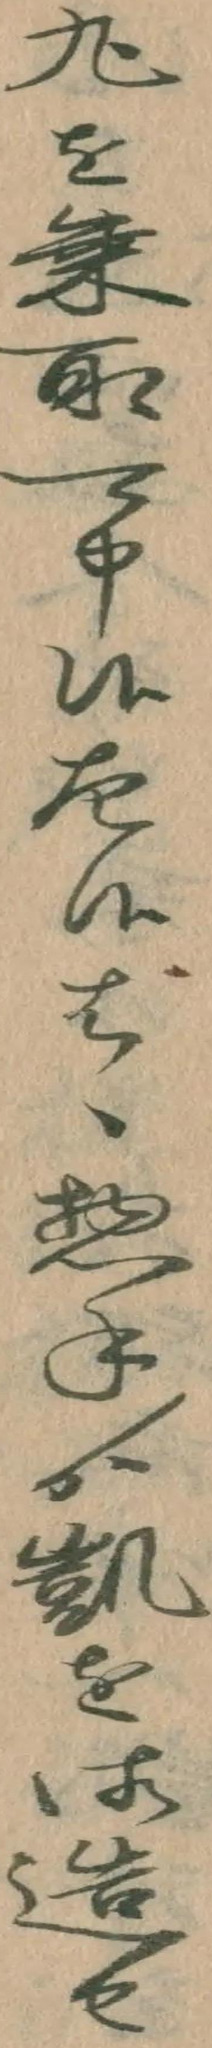丸を乗取可申候左候者々惣手ゟ凱を御造せ
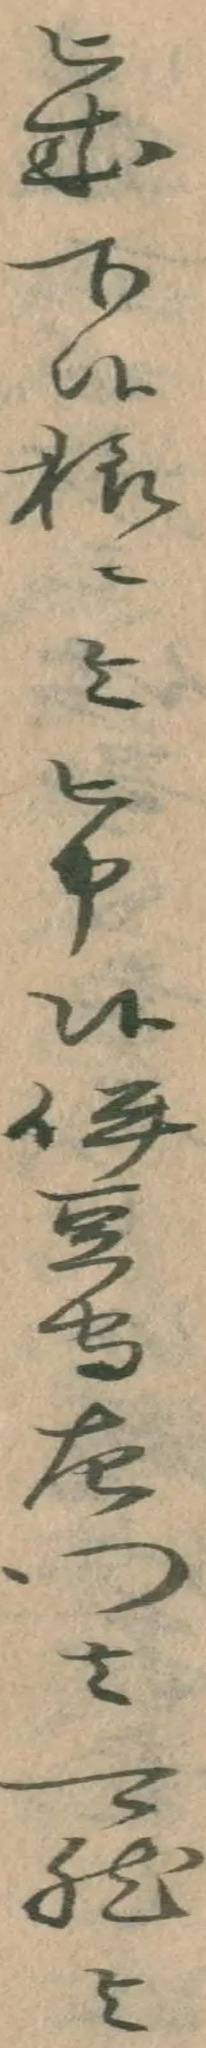被成下候様に与被申候伊豆守左門者可然与
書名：切支丹御退治記 49巻. [7]
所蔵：国立国会図書館 National Diet Library, JAPAN
